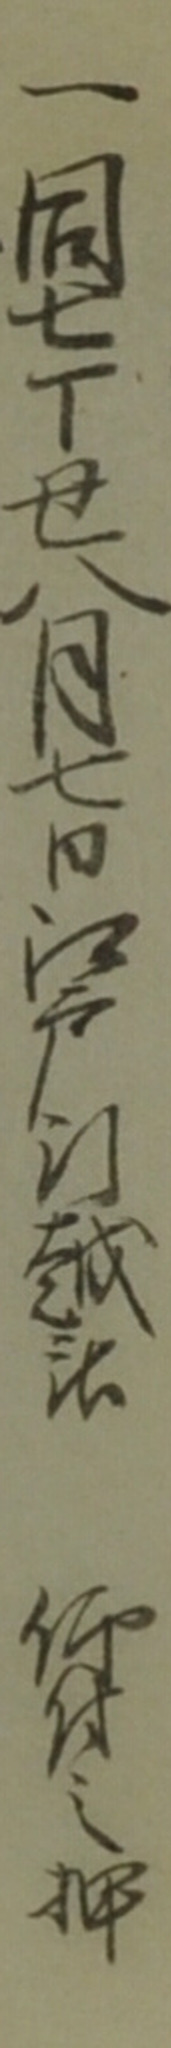一同七丁丑八月七日江戸引越被仰付之押
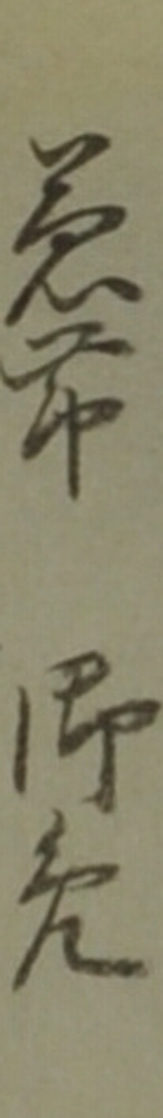兼帯御免
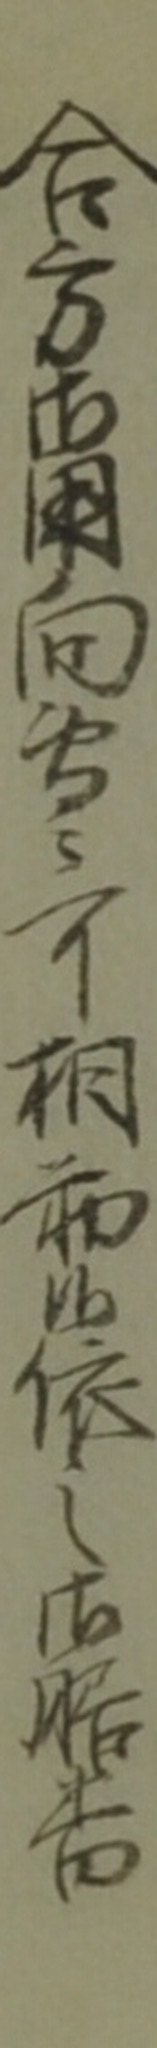合方御用向専ら可相勤候依之御膳番
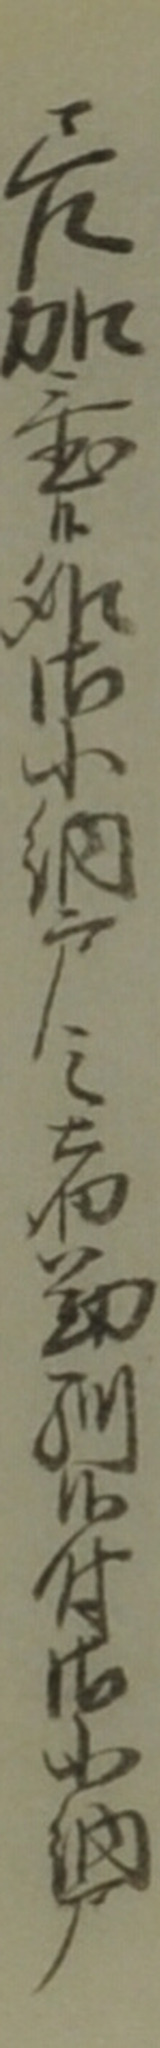差加置候処御小納戸之者勤馴候付小納戸
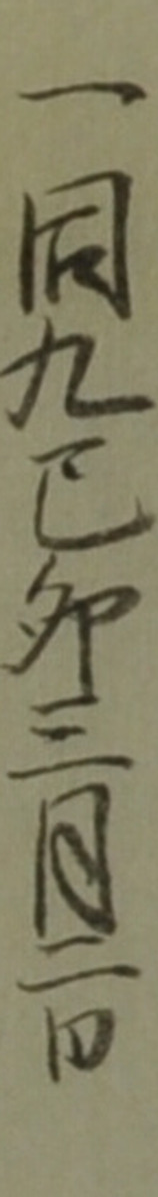一同九己卯三月二日
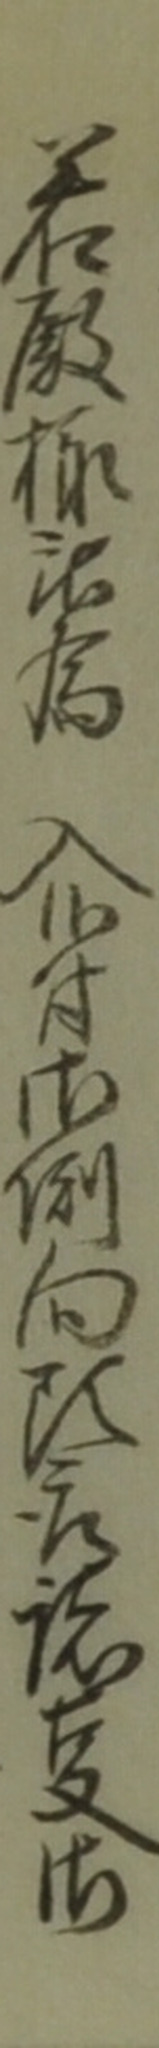若殿様被為入候付御側向頭取諸事御
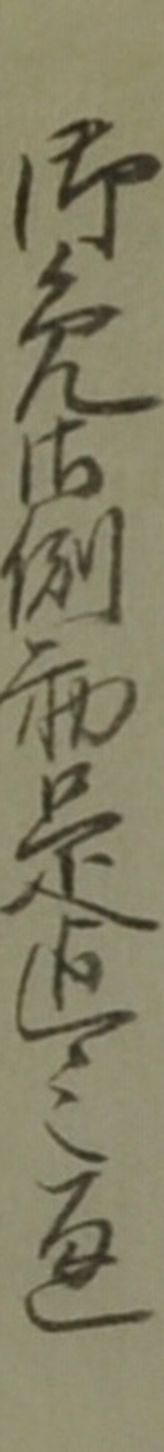御免御側勤是迄之通
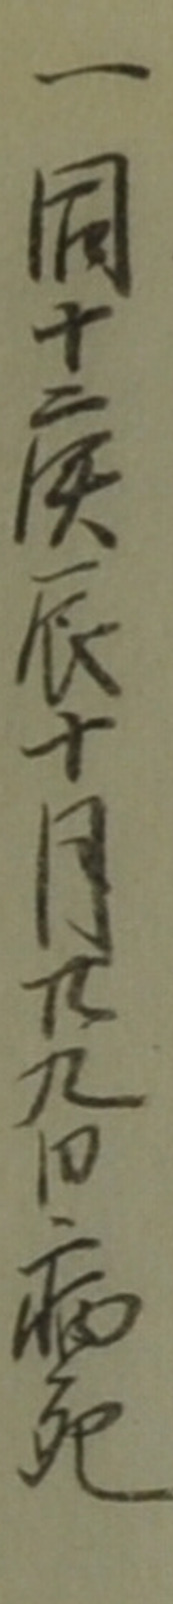一同庚辰十月廿九日病死
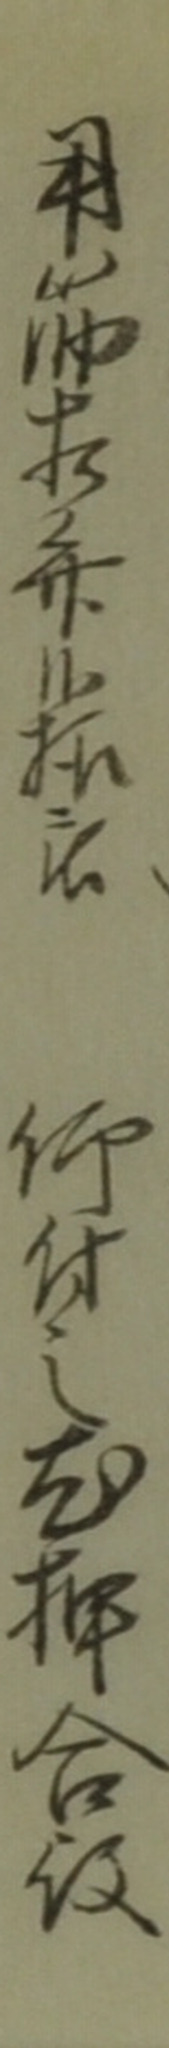用筋相弁候様被仰付之尤押合役
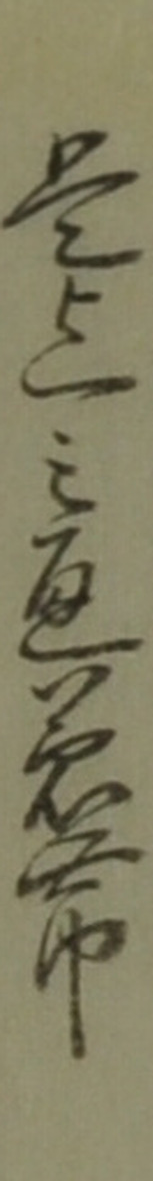是迄之通兼帯
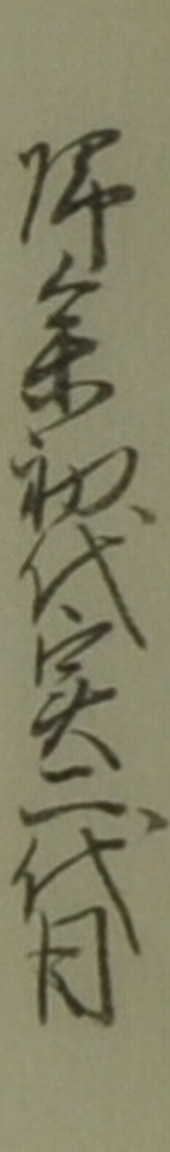帰参初代実二代目
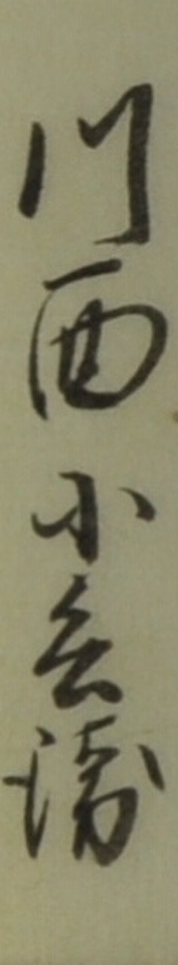川面小兵衛

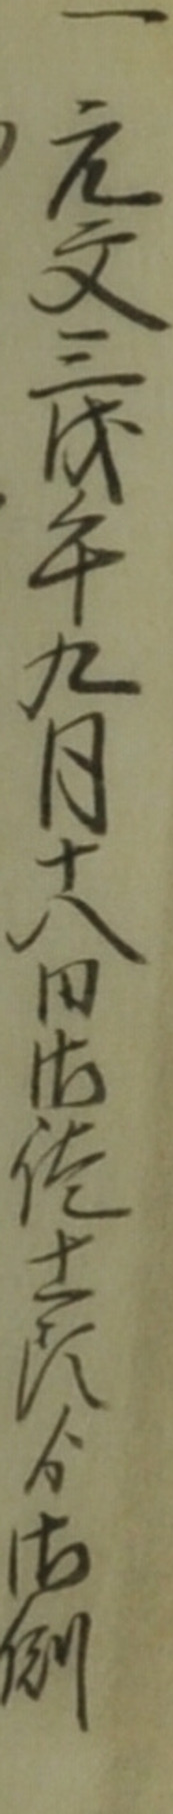一元文三戊午九月十八日御徒士頭ゟ御側
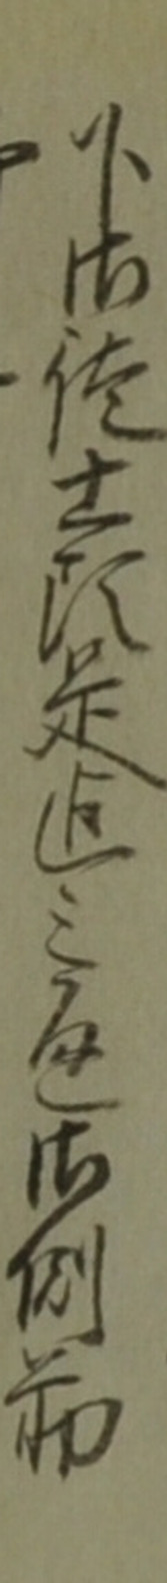下御徒士頭是迄之通お御側勤
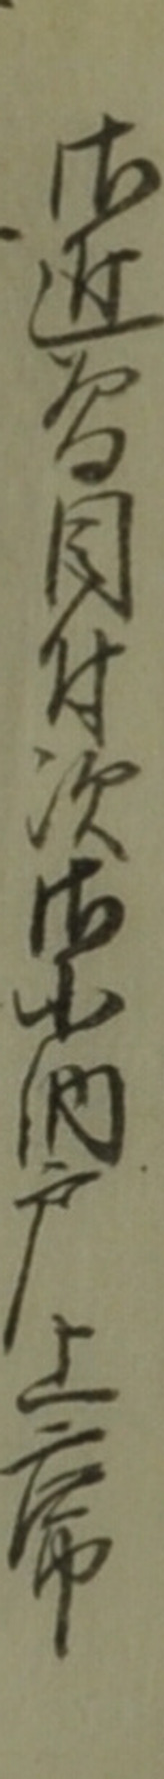御近習目付次御小納戸上席
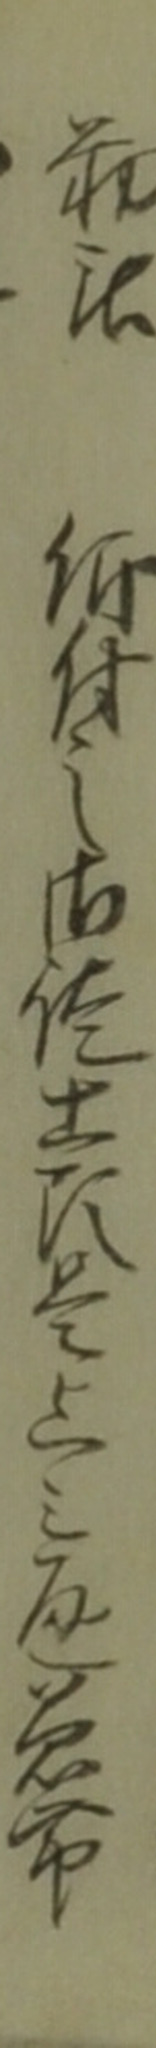勤被仰付之御徒士頭是迄之通兼帯
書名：諸御役代々録（五）
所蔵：伊那市立高遠町図書館・合同会社AMANE
